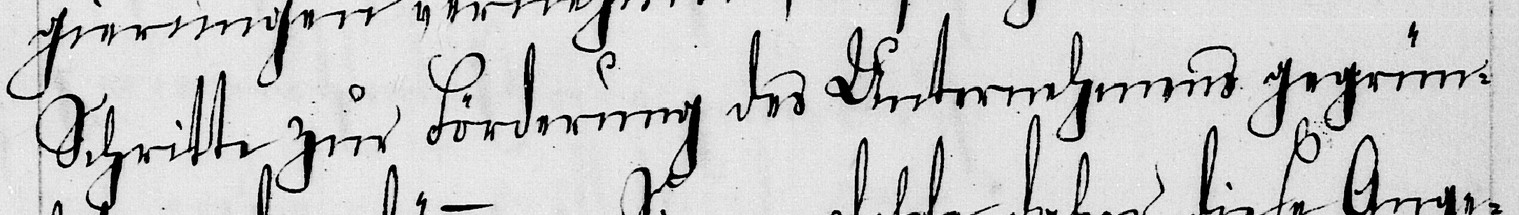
Schritte zur Förderung des Unternehmens gegrün¬
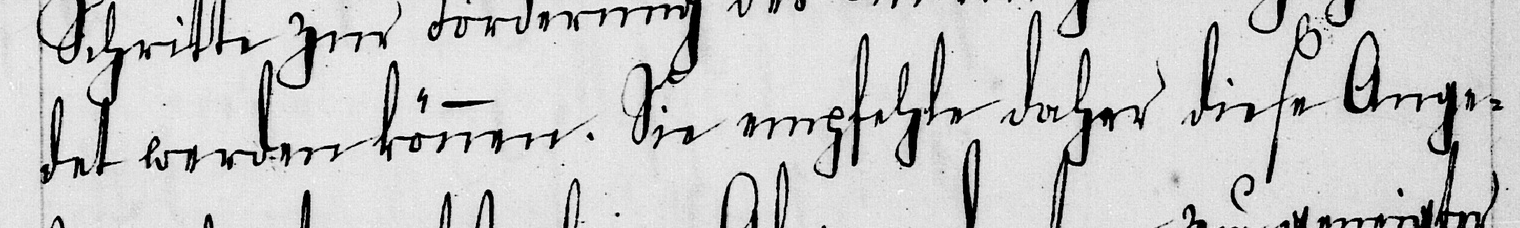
det werden können. Sie empfehle daher diese Ange¬
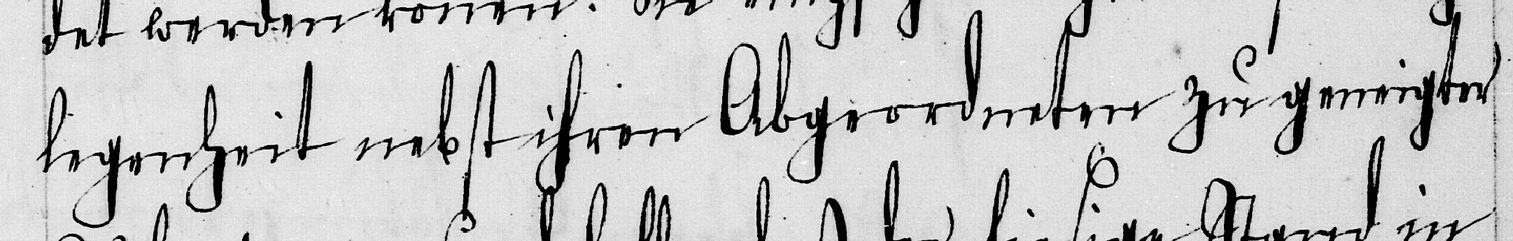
legenheit nebst ihren Abgeordneten zu geneigter
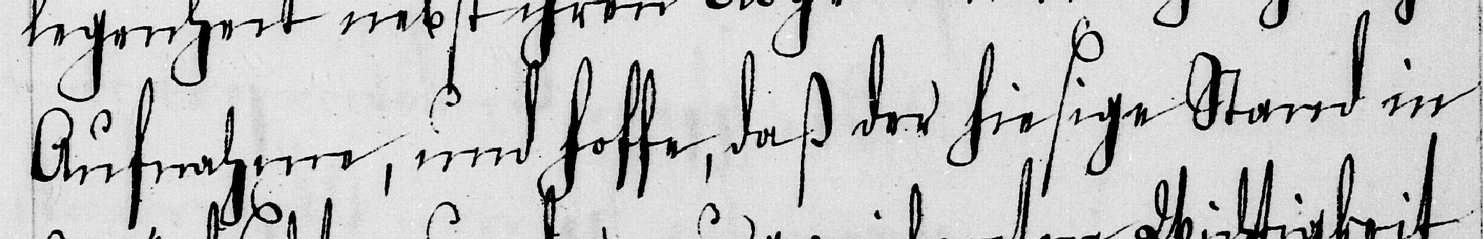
Aufnahme, und hoffe, daß der hiesige Stand in
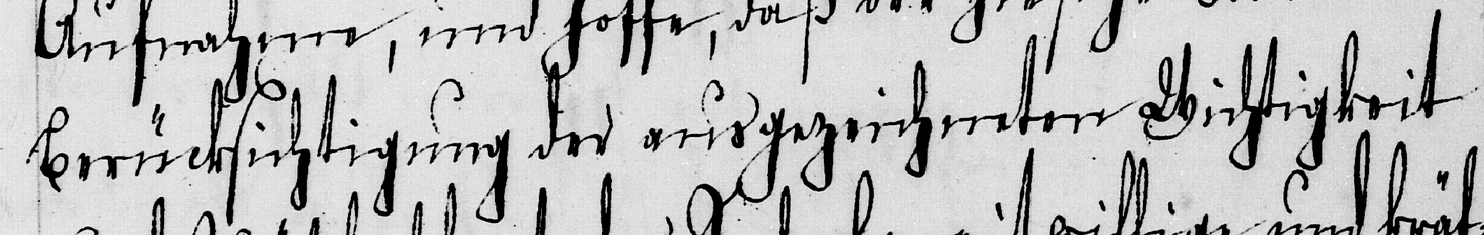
Berücksichtigung der ausgezeichneten Wichtigkeit
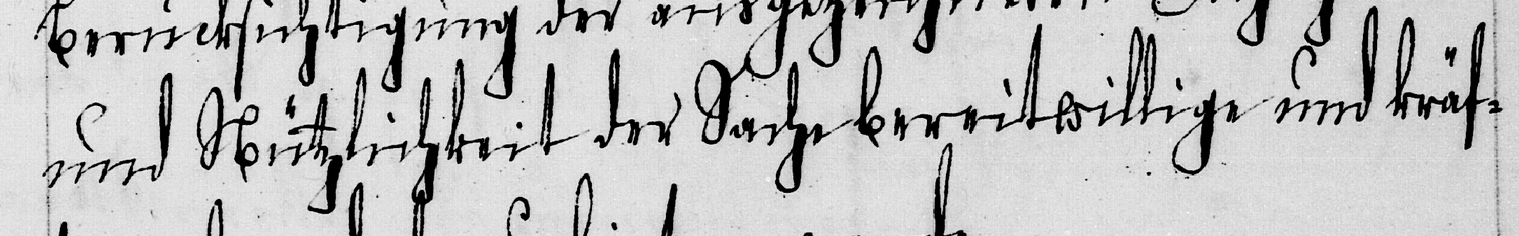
und Nützlichkeit der Sache bereitwillige und kräf¬
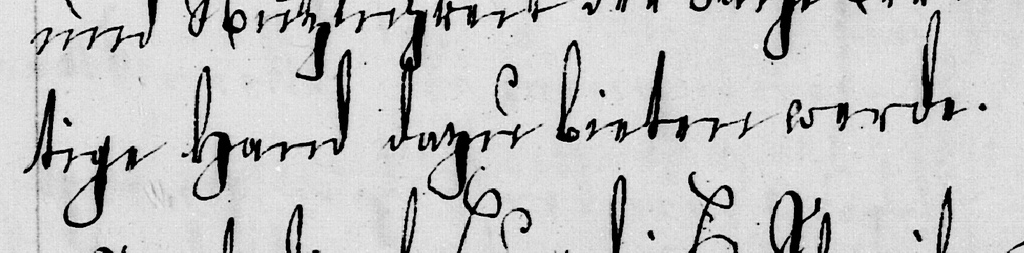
tige Hand dazu bieten werde.
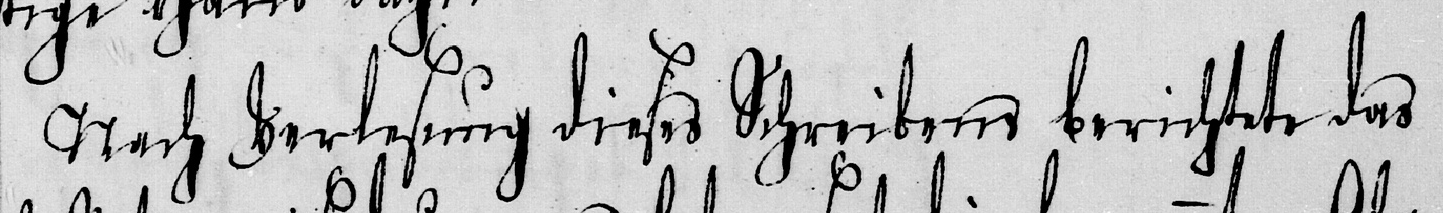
Nach Verlesung dieses Schreibens berichtete das
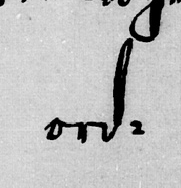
och
